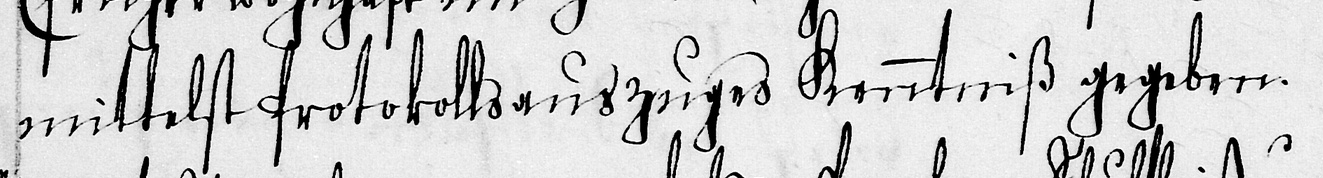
mittelst Protokollsauszuges Kenntniß gegeben.
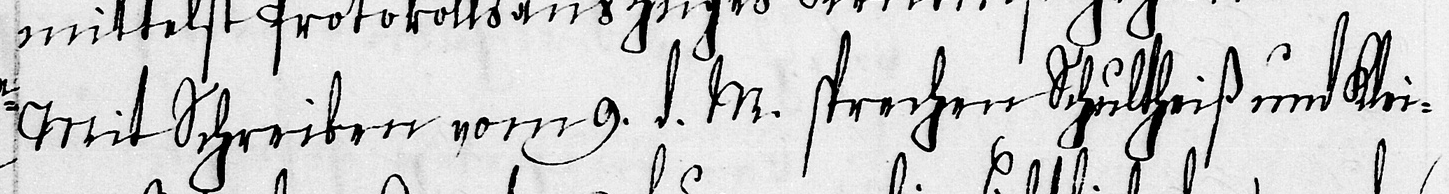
Mit Schreiben vom 9. d. M. sprechen Schultheiß und Klei¬
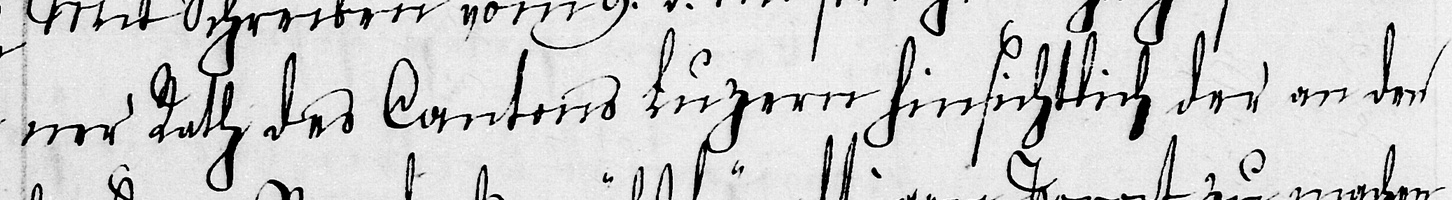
ner Rath des Cantons Luzern hinsichtlich der an den
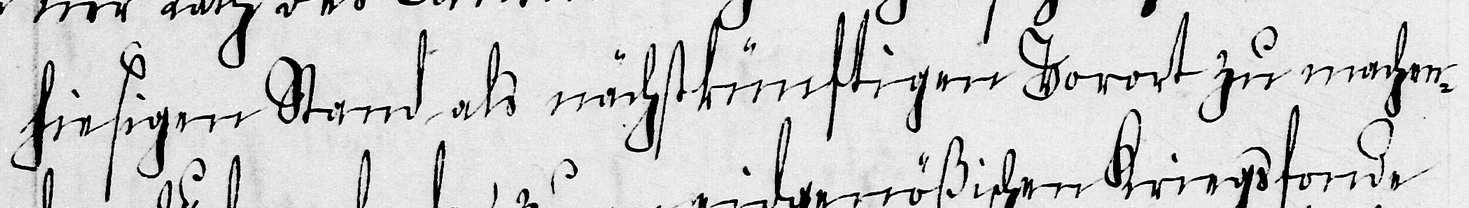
hiesigen Stand als nächstkünftigen Vorort zu machen¬
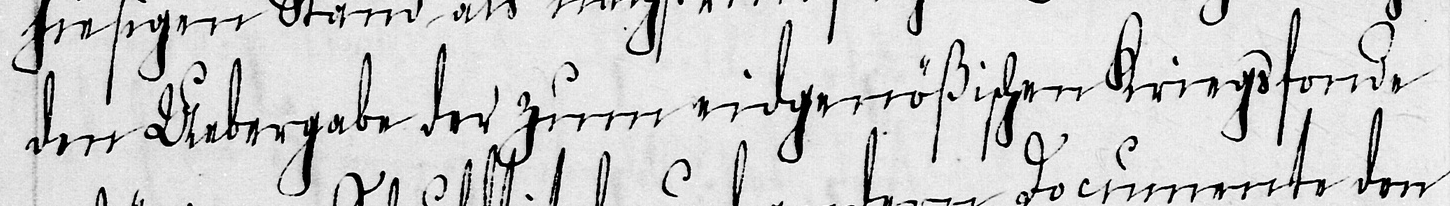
den Uebergabe der zum eidgenößischen Kriegsfonde
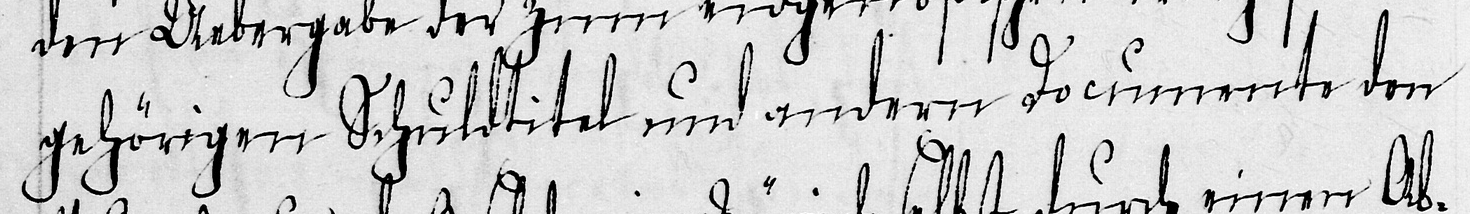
gehörigen Schuldtitel und andern Documente den
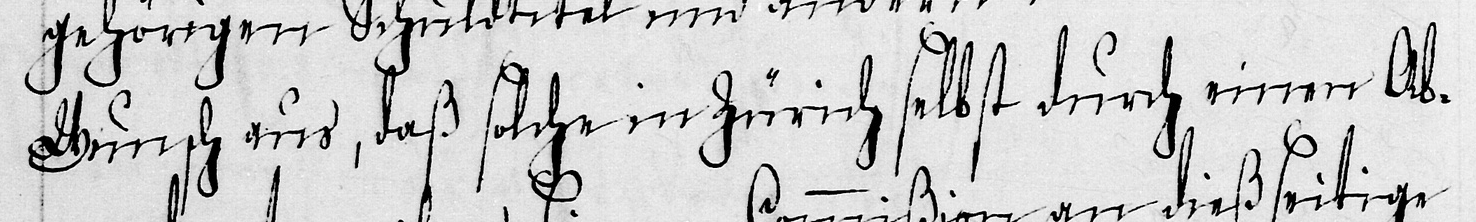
Wunsch aus, daß solche in Zürich selbst durch einen Ab¬
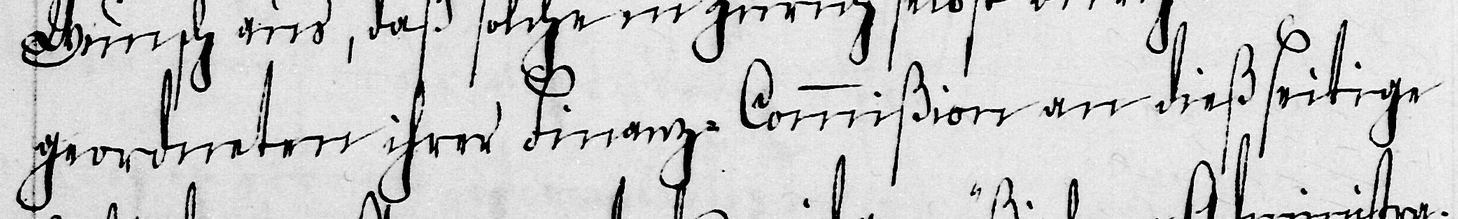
geordneten ihrer Finanz-Commißion an dießseitige
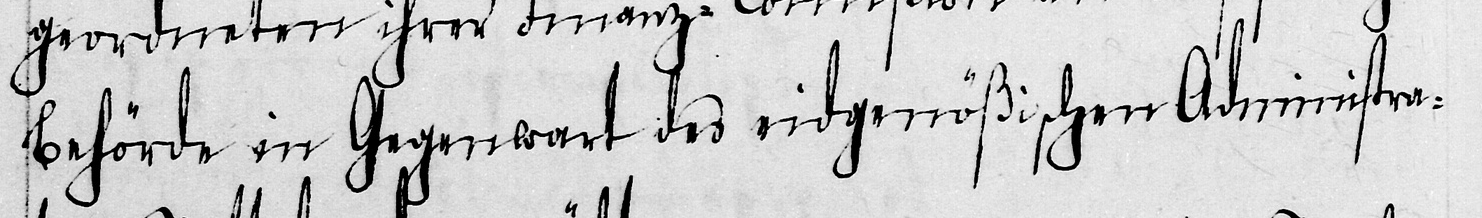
Behörde in Gegenwart des eidgenößischen Administra¬
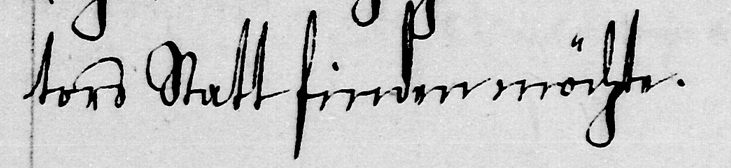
tors Statt finden möchte.
